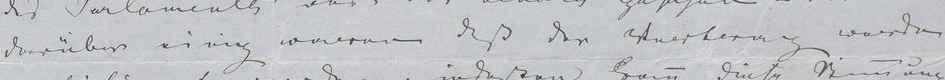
darüber einig waren, daß der Vertrag werde
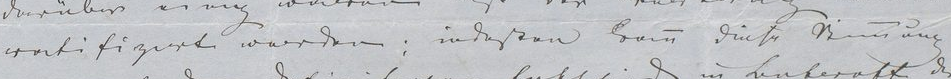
ratifizirt werden; indeßen kann diese Stimmung
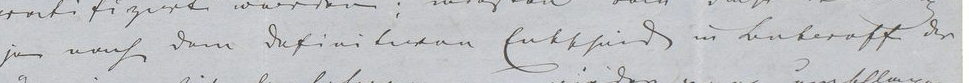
je nach dem definitiven Entscheid in Betreff der
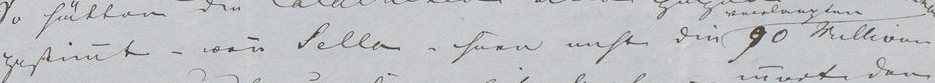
gestimmt, wenn Sella ihnen nicht die verlangten 90 Millionen
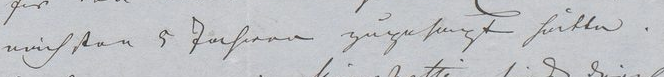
nächsten 5 Jahren zugesagt hätte.
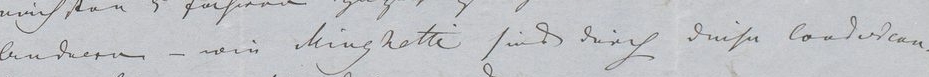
Andere, wie Minghetti sind durch diese Condescen-
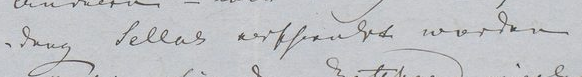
denz Sellas erschrekt worden.
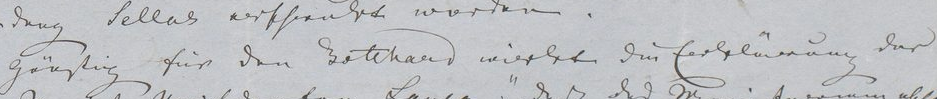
Günstig für den Gotthard wirkt die Erklärung des
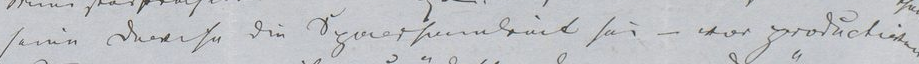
seine Devise die Sparsamkeit sei, vor productiven
